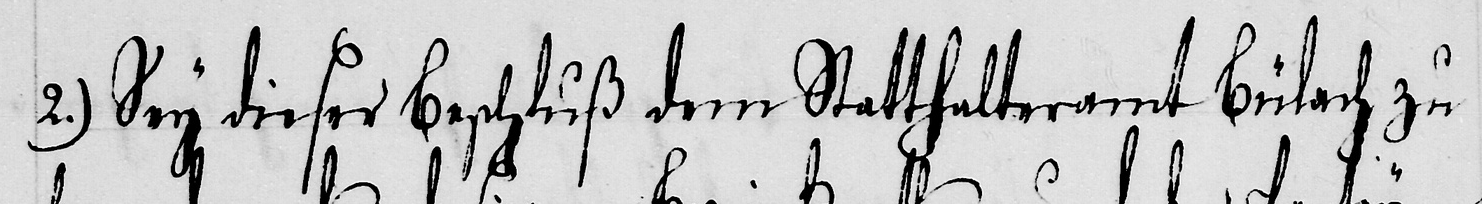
2.) Sey dieser Beschluß dem Statthalteramt Bülach zu
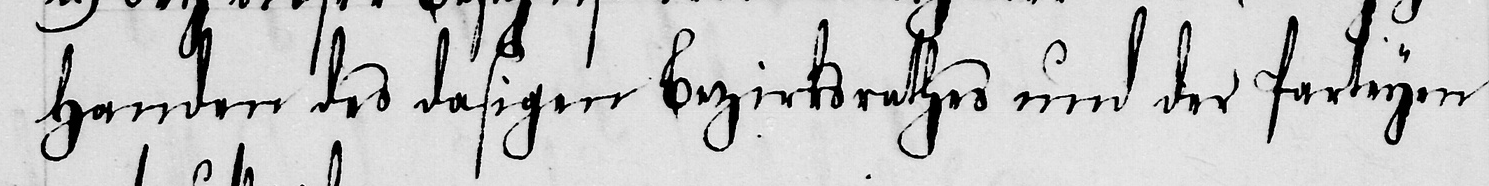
Handen des dasigen Bezirksrathes und der Parteyen
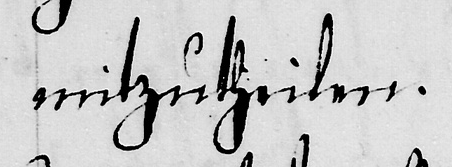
mitzutheilen.
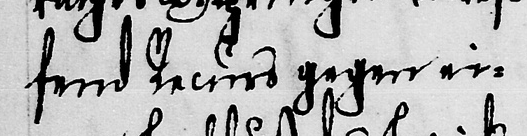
fend Recurs gegen ei¬
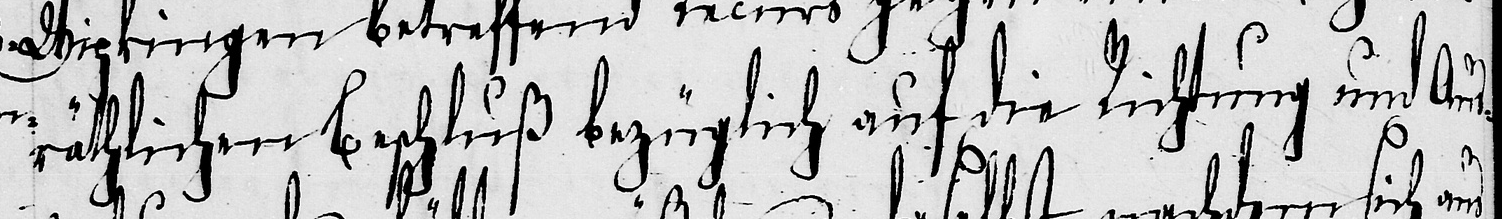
sräthlichen Beschluß bezüglich auf die Richtung und Aus¬
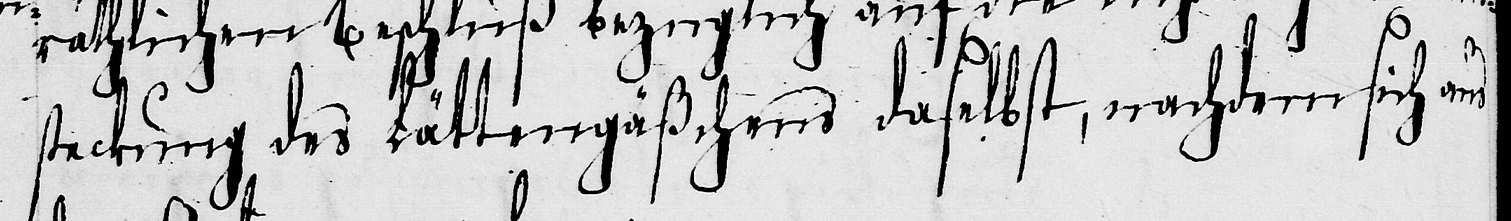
steckung des Lättengäßchens daselbst, nachdem sich a¬
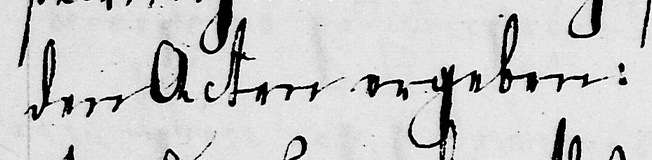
den Acten ergeben:
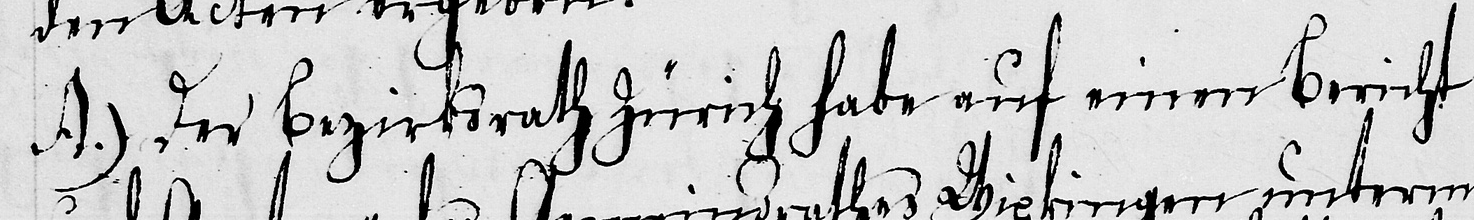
A.) Der Bezirksrath Zürich habe auf einen Bericht
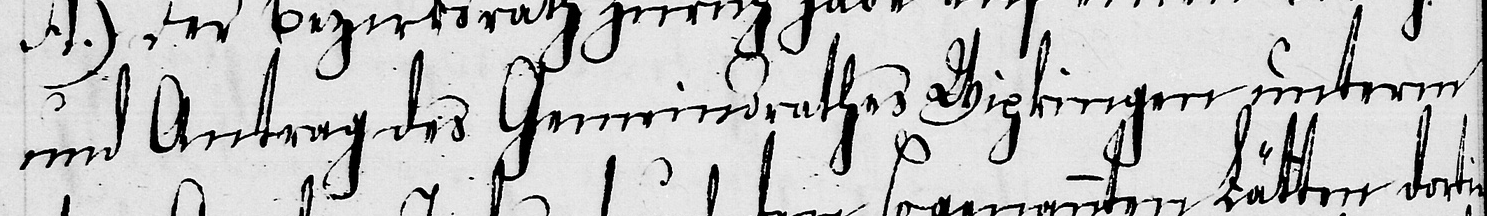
und Antrag des Gemeindrathes Wipkingen unterm
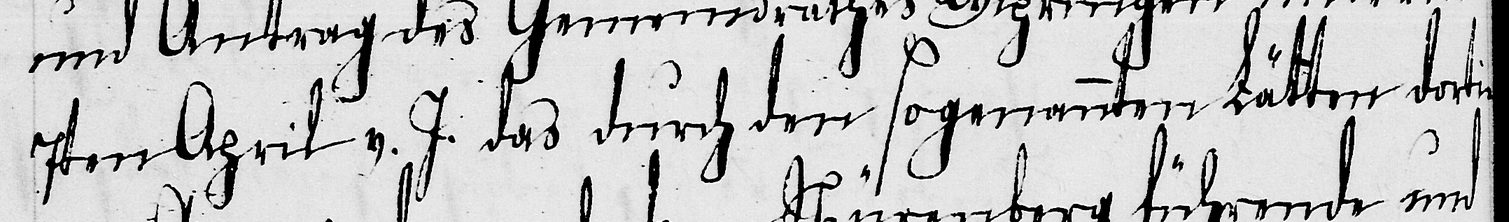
7ten April v. J. das durch den sogenannten Lätten dort¬
